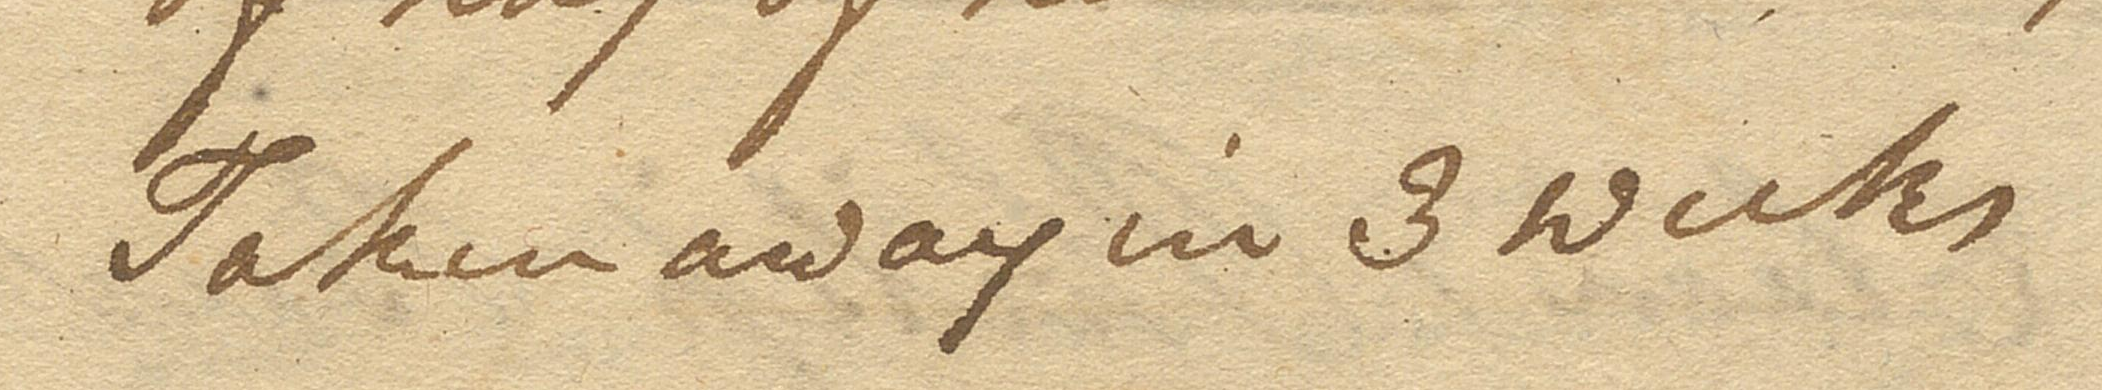Taken away in 3 weeks
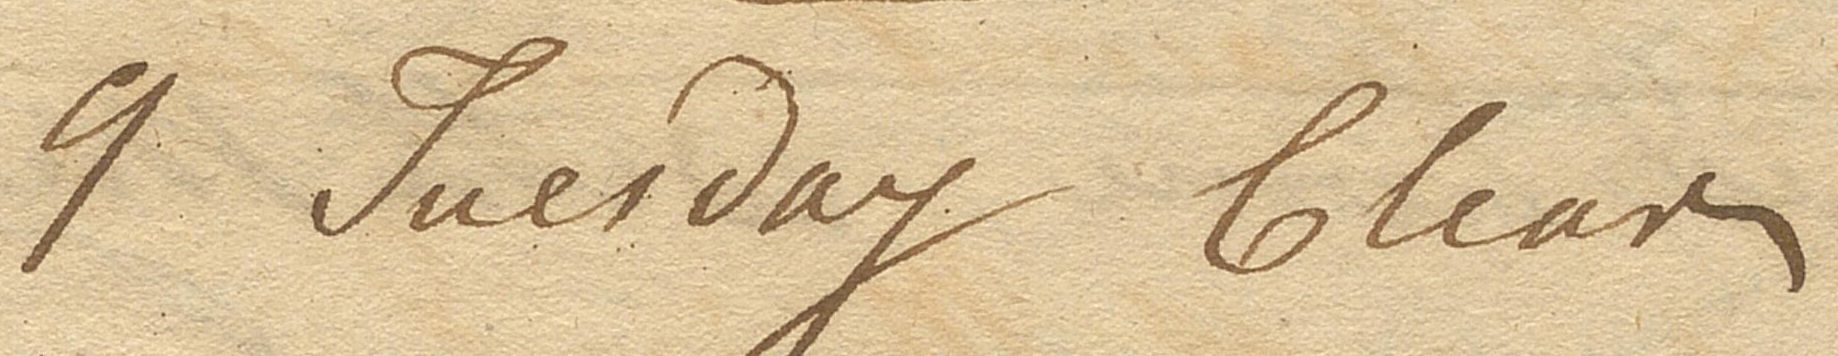9 Tuesday Clear
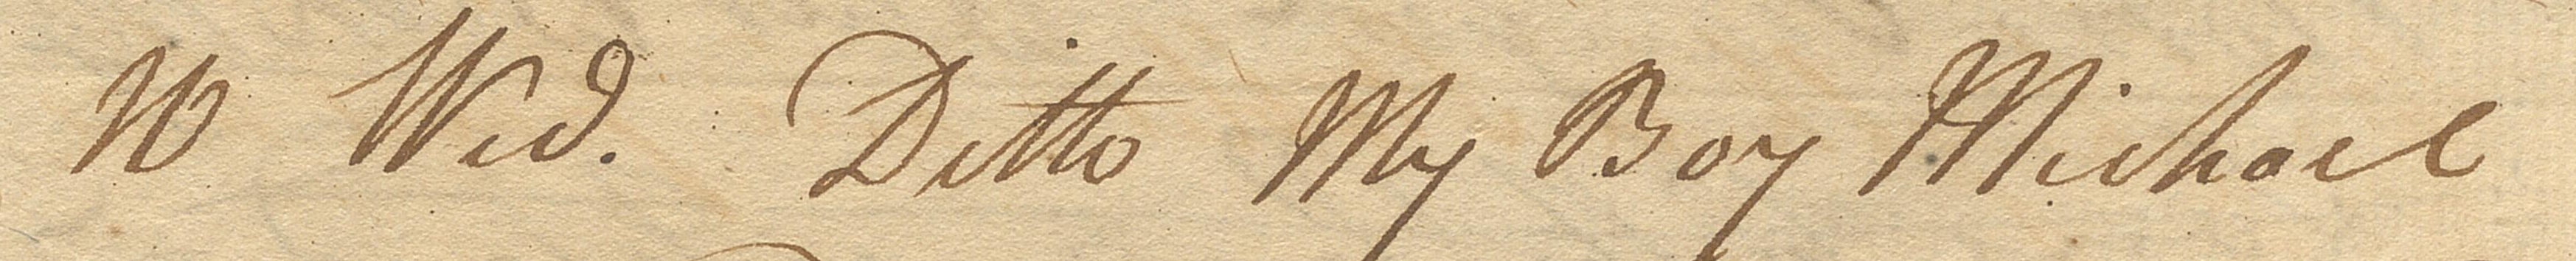10 Wed. Ditto My Boy Michael
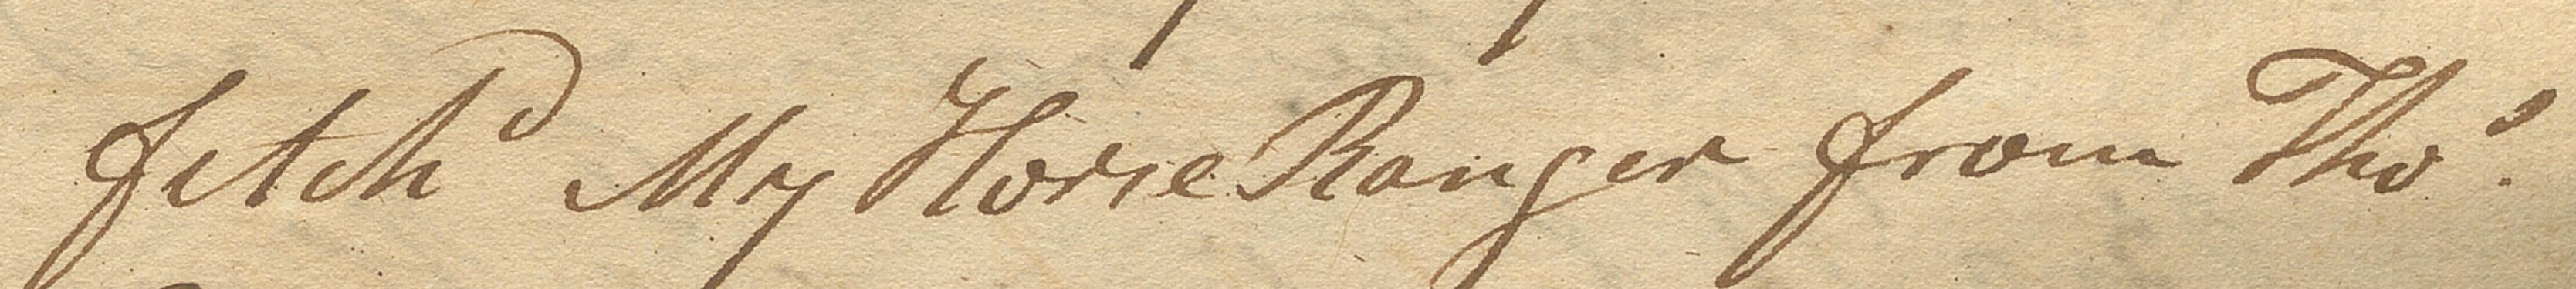fetch^d My Horse Ranger from Tho^s.
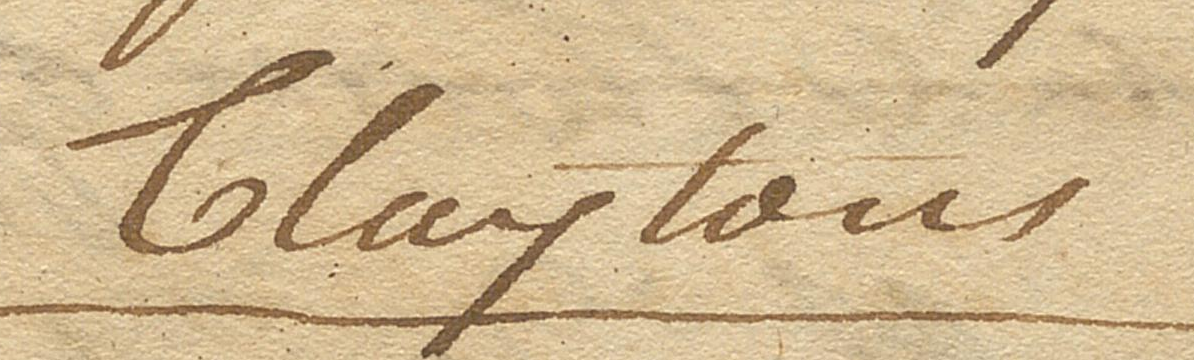Claytons
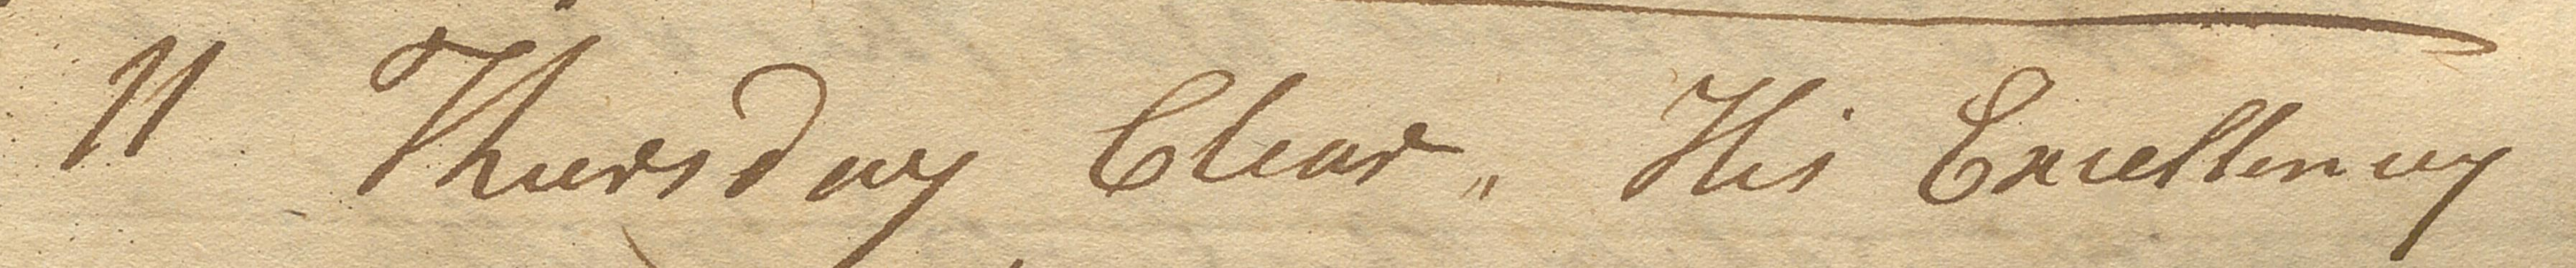11 Thursday Clear, His Excelencey
